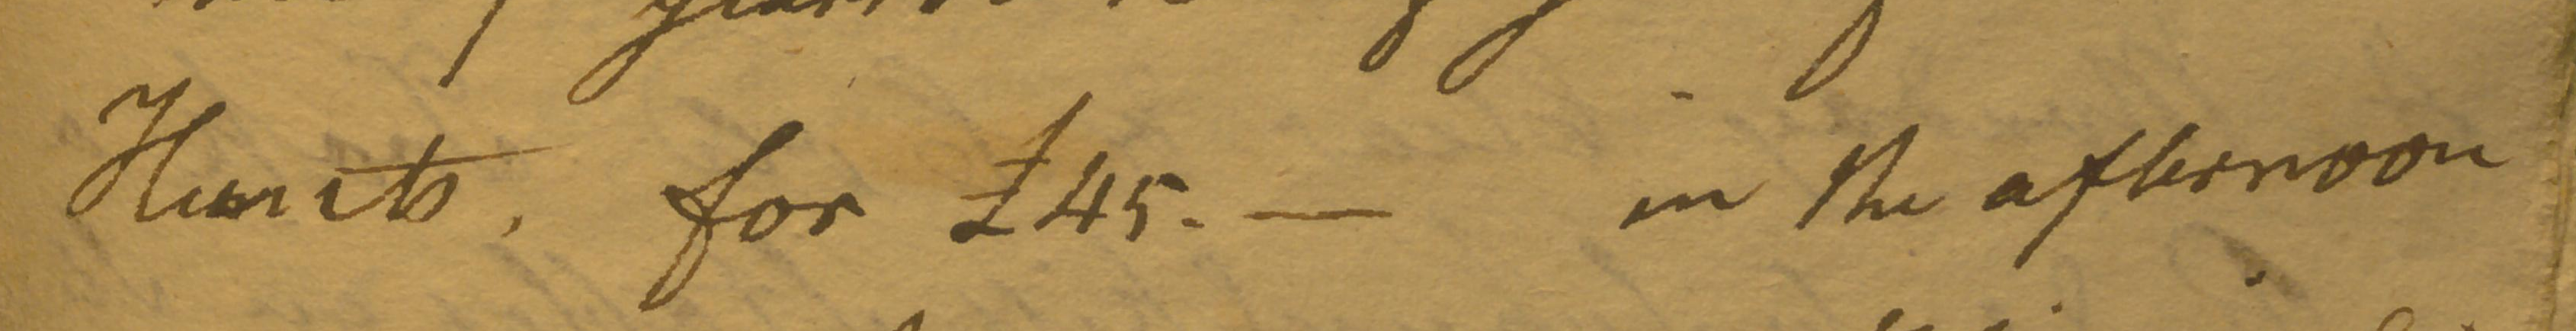Hunts. for £45- in the afternoon
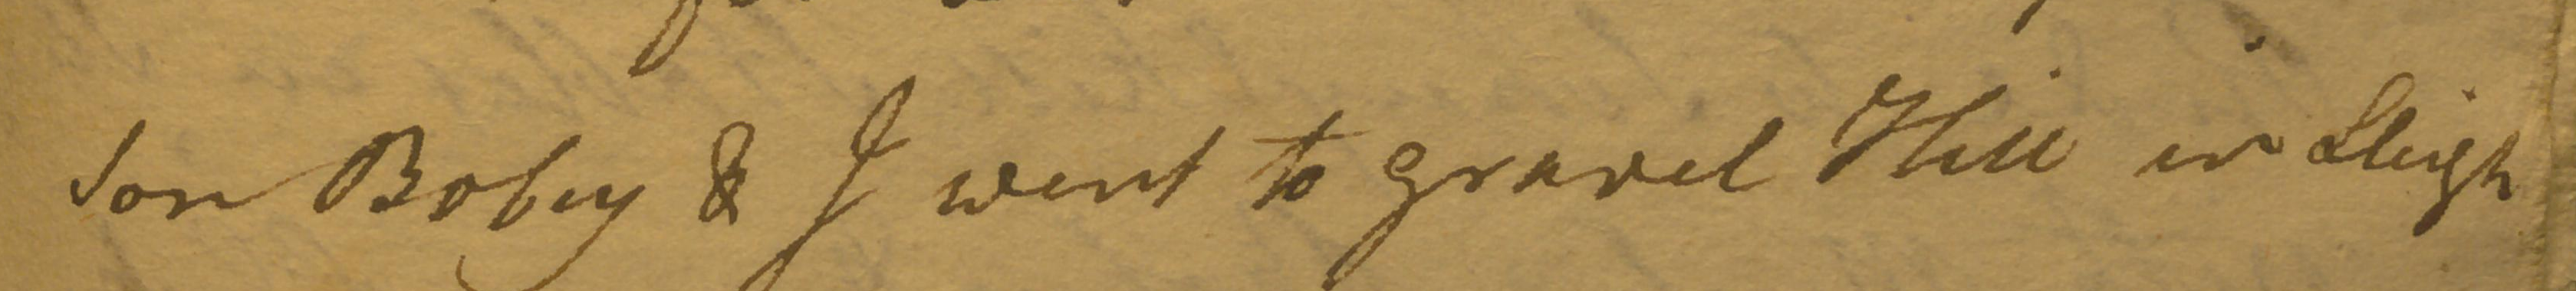son Bobey & I went to gravel Hill in sleigh
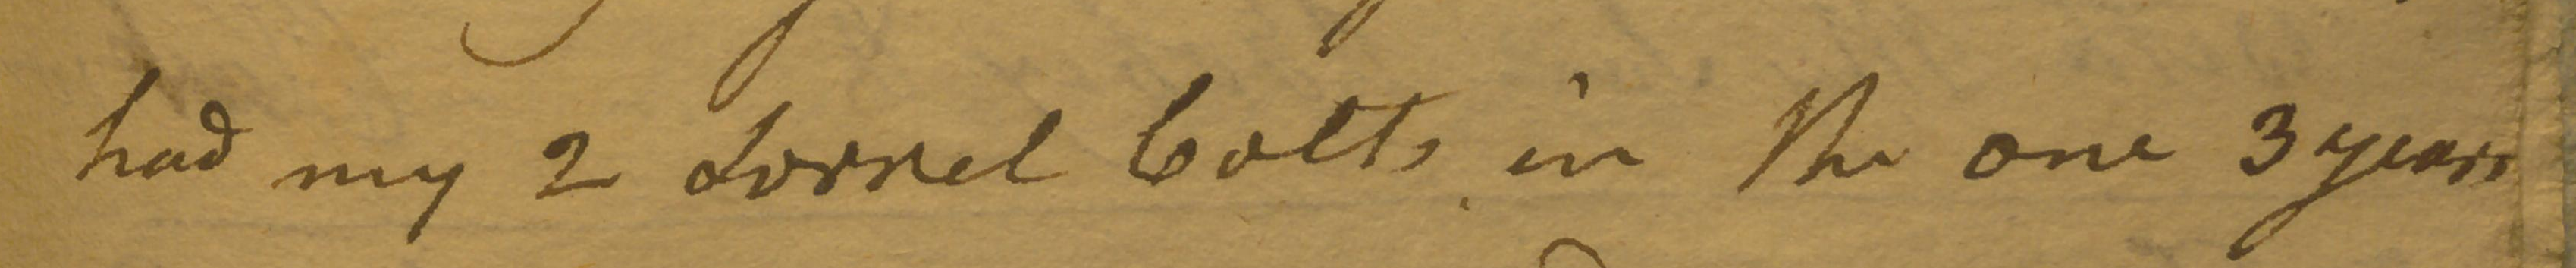had my 2 sorrel Colts in the one 3 years
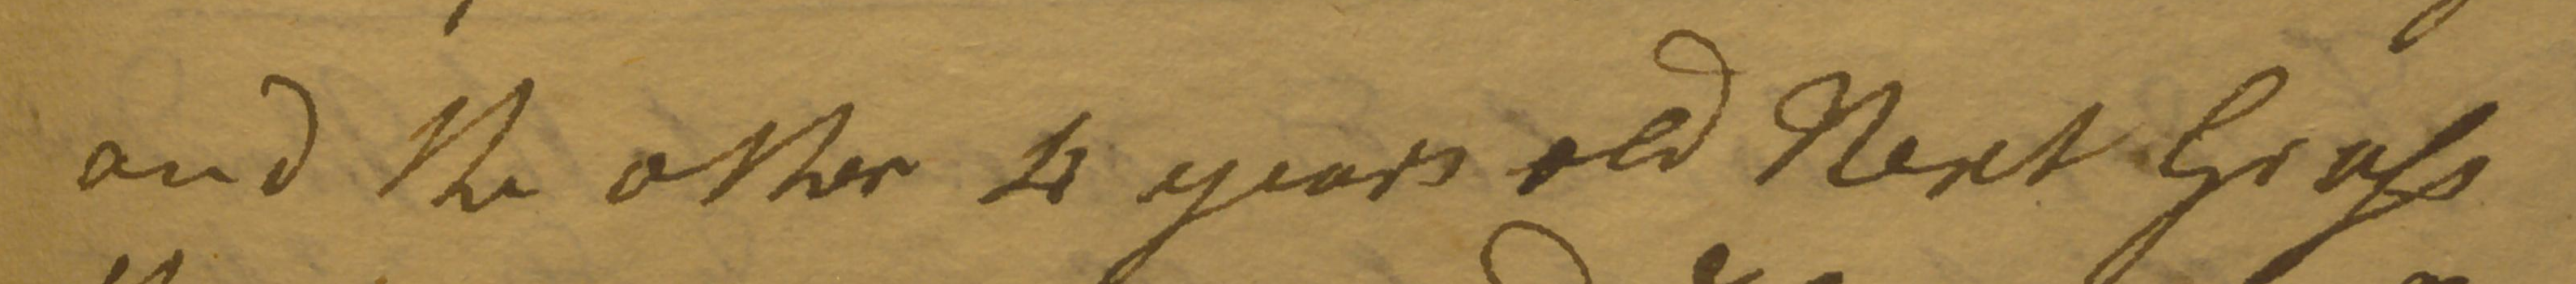and the other 4 years old Next Grass
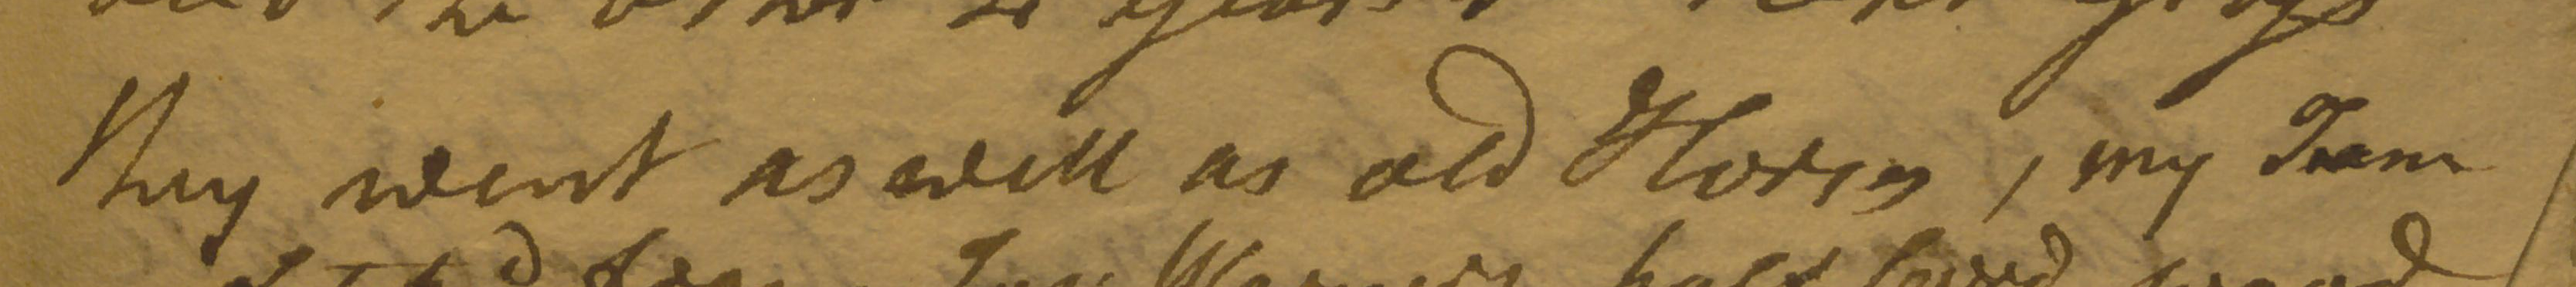they went as well as old Horse, my Team
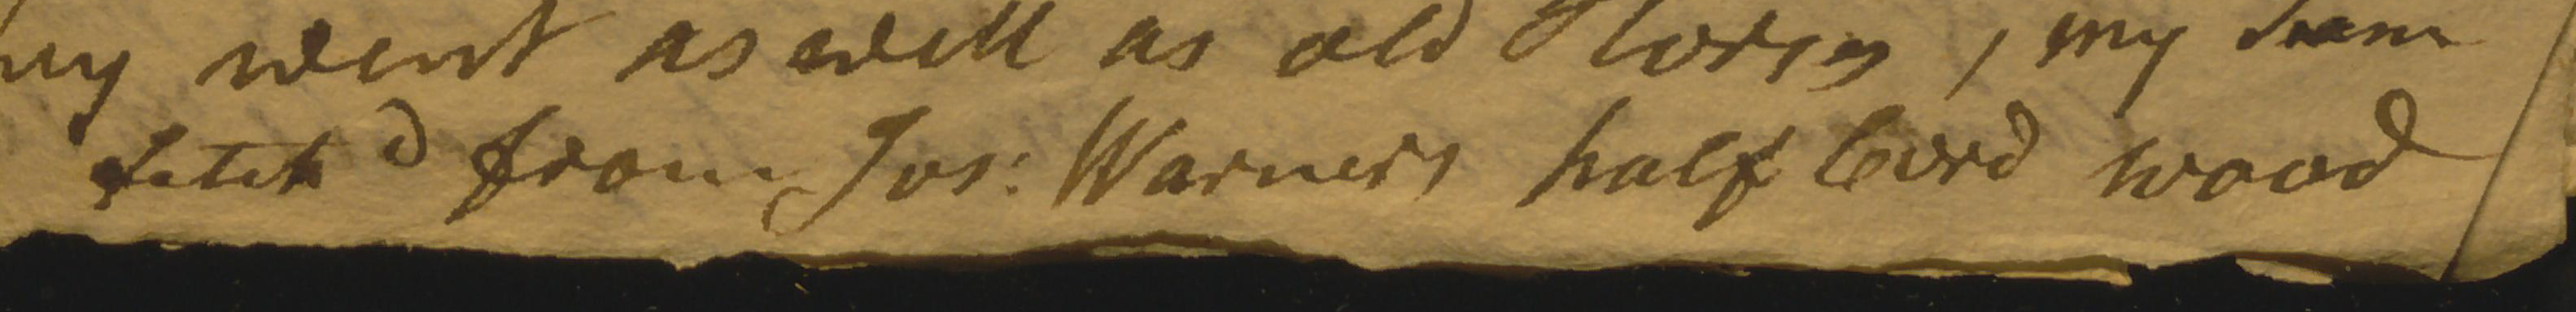fetchd from Jos. Warners half Cord wood
